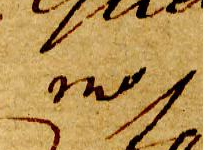me
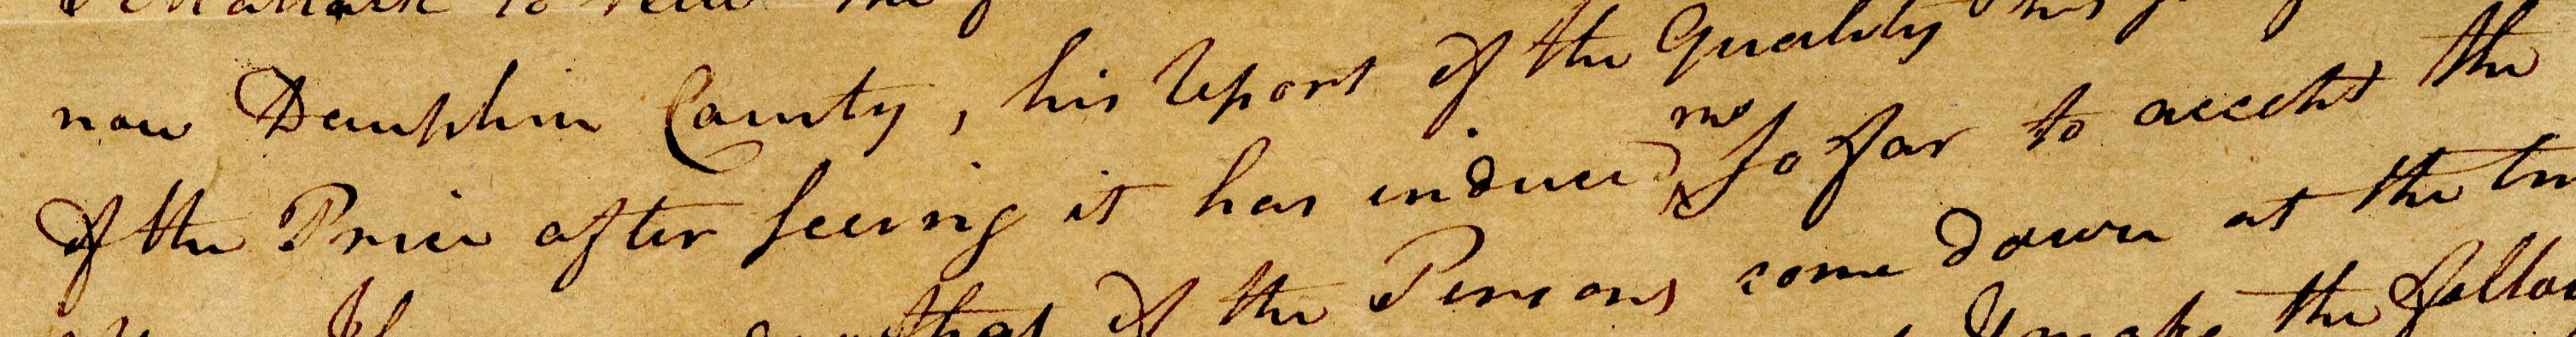of the Price after seeing it has induced ^ so far to accept the
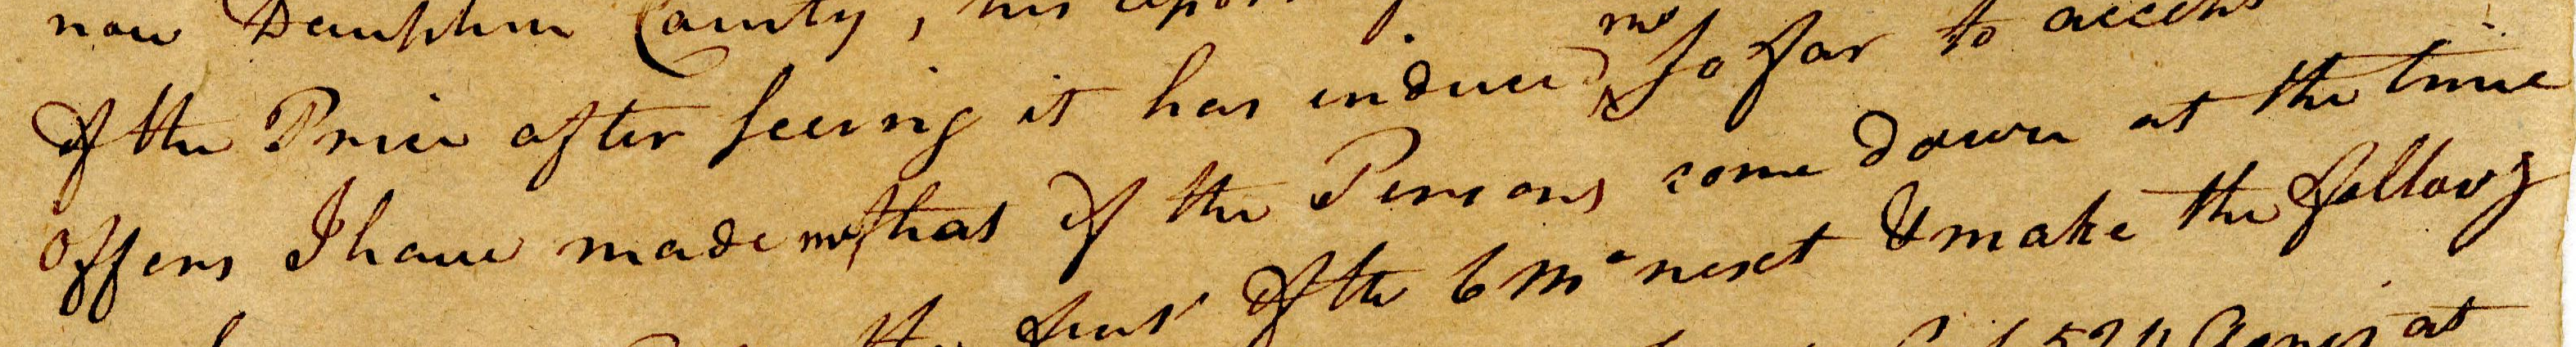offers I have made me that if the Persons come down at the time
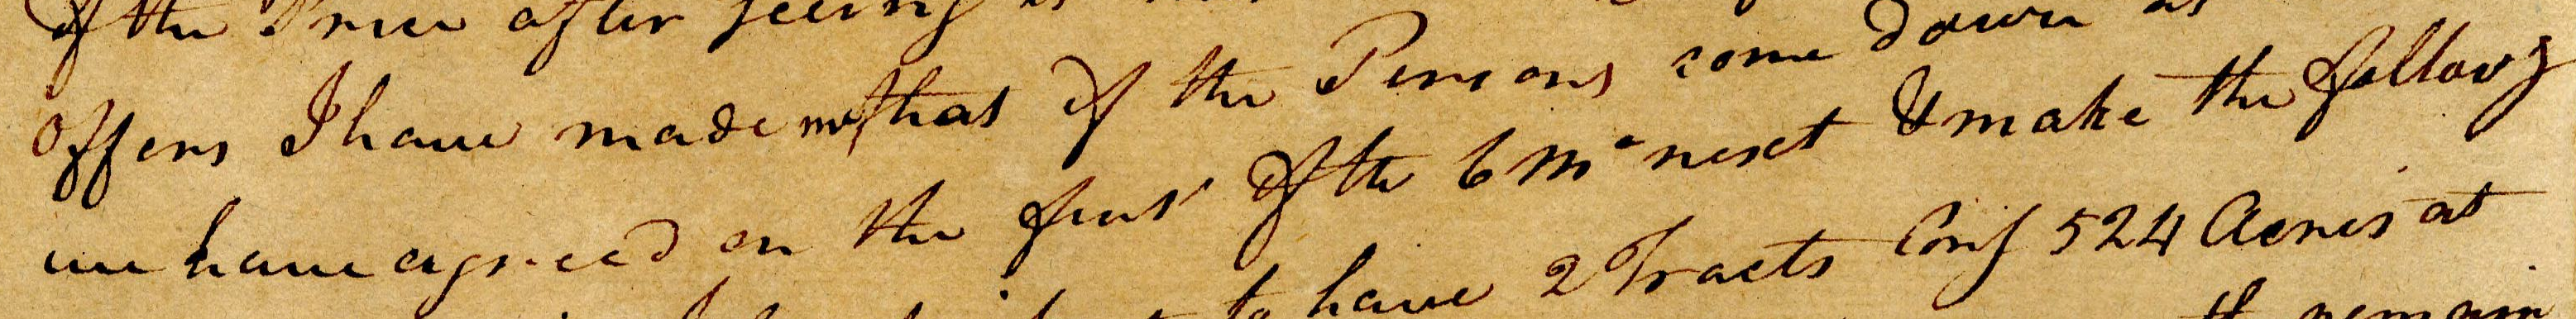we have agreed on the first of the 6 m^o next & make the followg
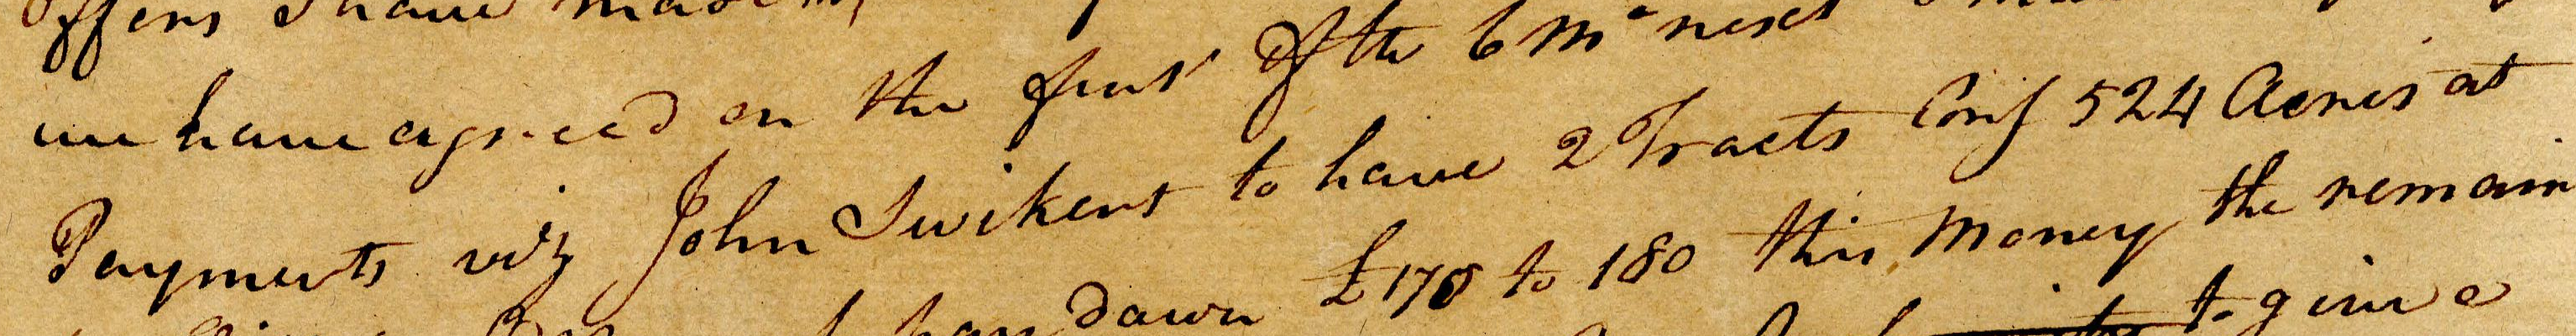Payments by John Swikens to have 2 Tracts Cons 524 Acres at
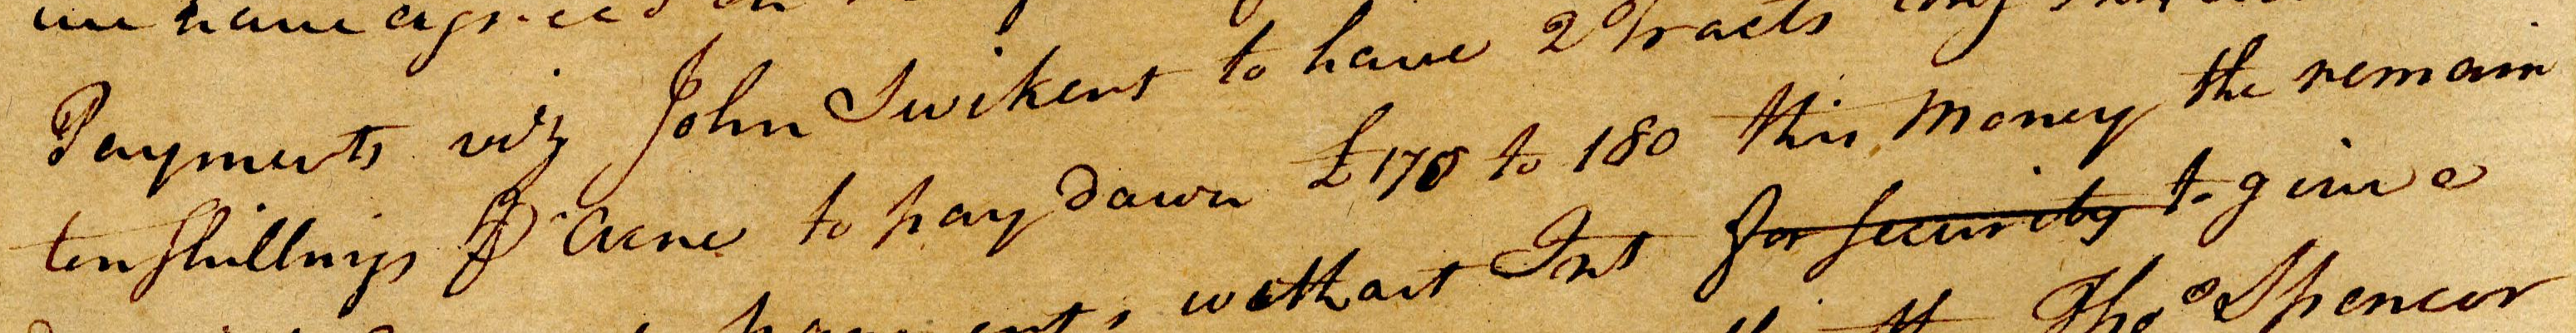ten shillings per acre to pay down £170 to 180 this money the remain
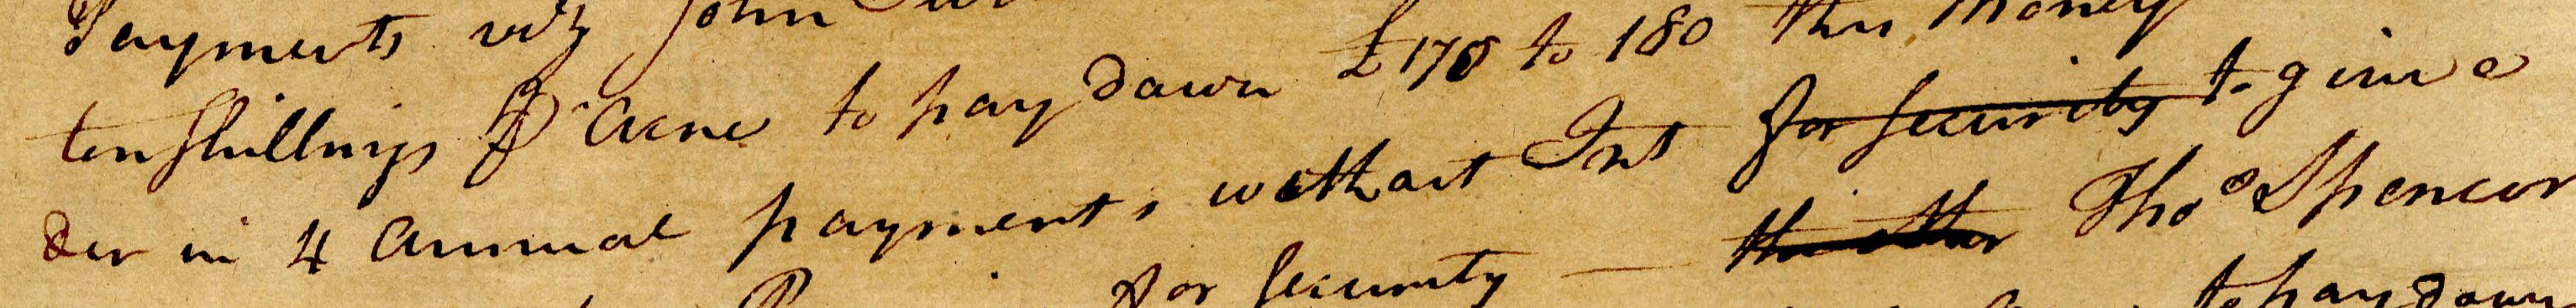der in 4 annual payments without Int [for security] to give a
